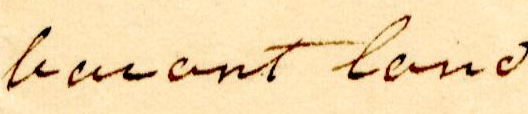vacant Land
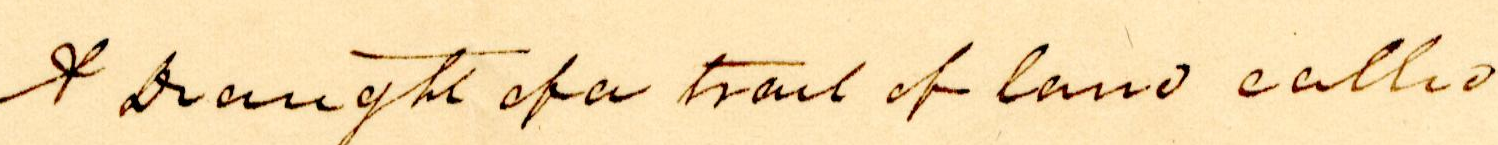A Draught of a tract of land called
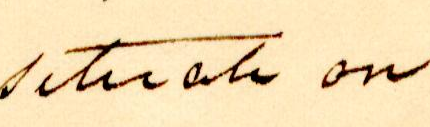situate on
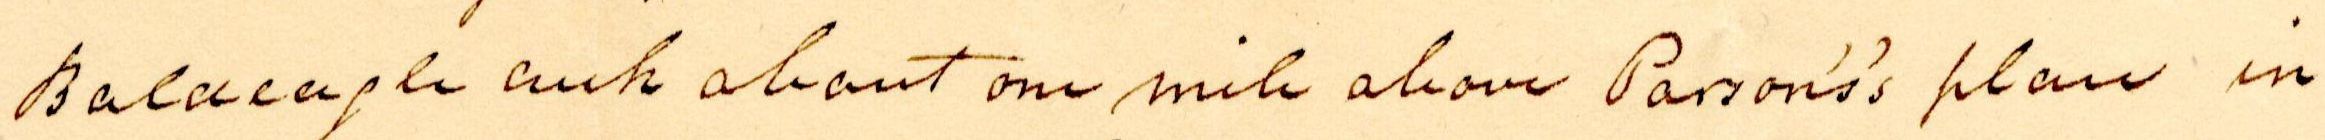Baldeagle such about one mile above Parson's's place in
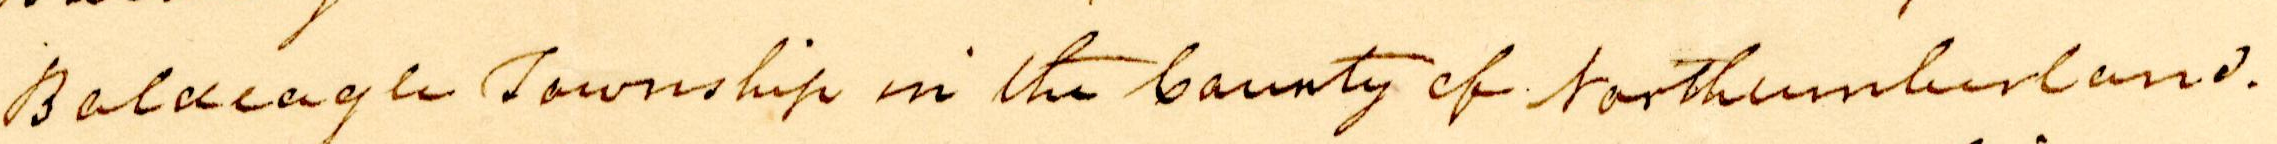Baldeagle Township in the County of Northumberland
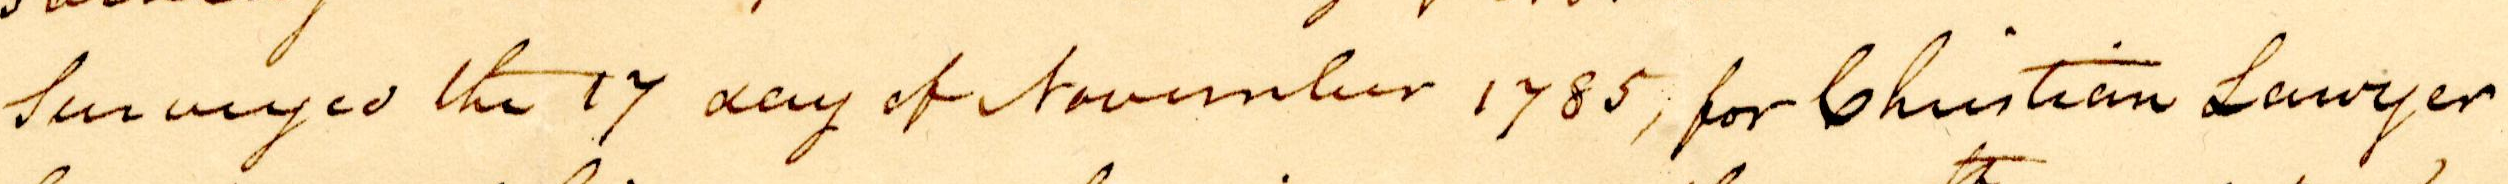surveyed the 17 day of November 1785, for Christian Lawyer
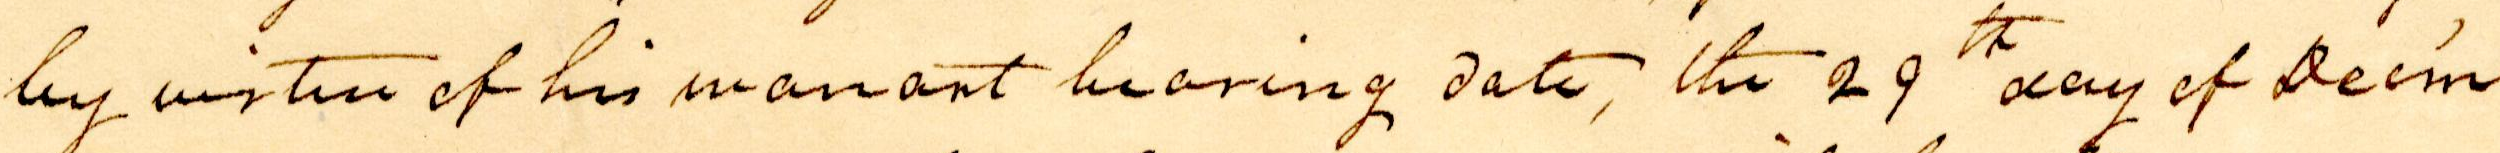by wirter of his warrant hearing date, the 29^th day of Decm
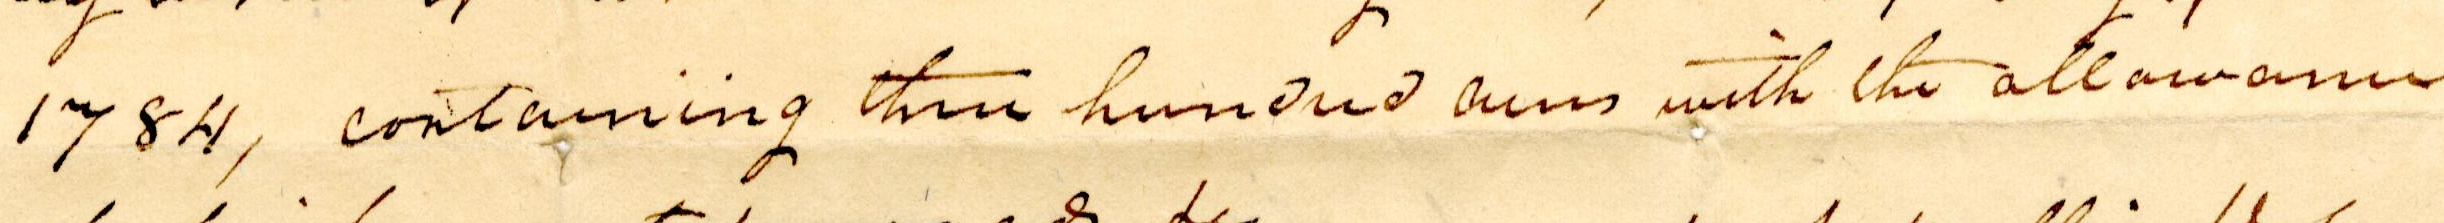1784, containing three hundred acres with the allowance
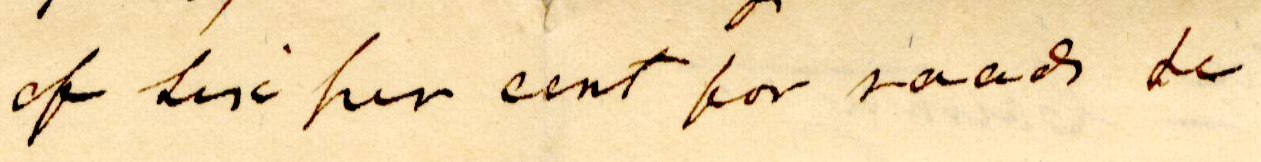of six per cent for roads &c
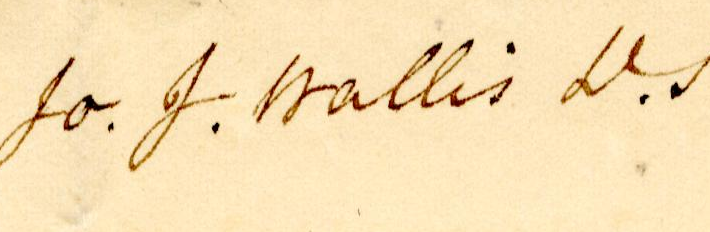Jo. J. Wallis D.S.
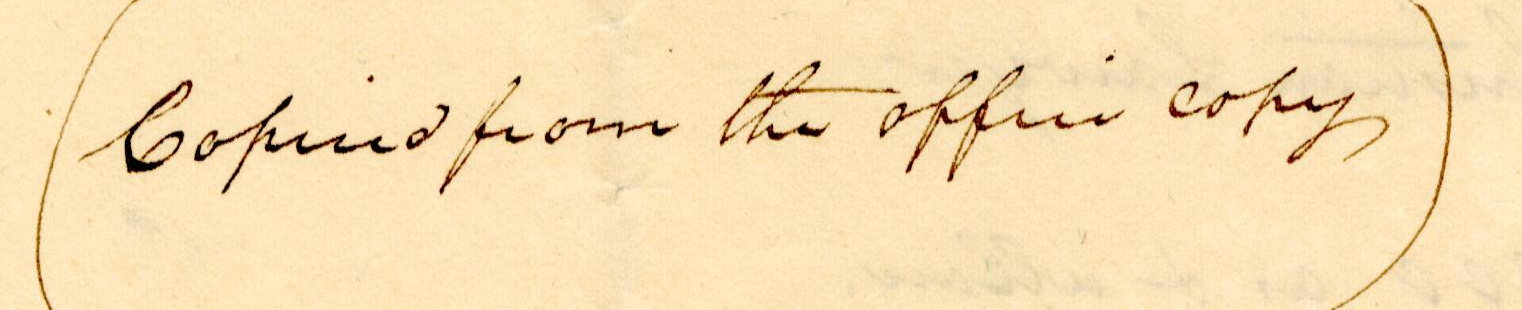(Copied from the office copy)
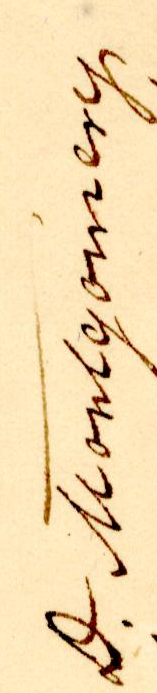D. Montgomery
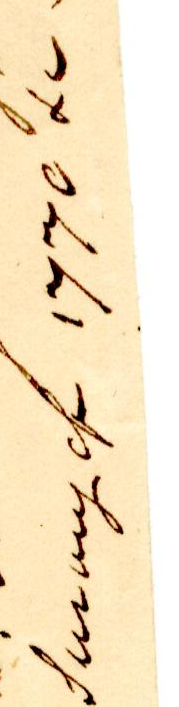January of 1770 &c
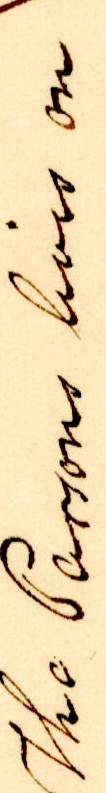Tho Parsons lives on
